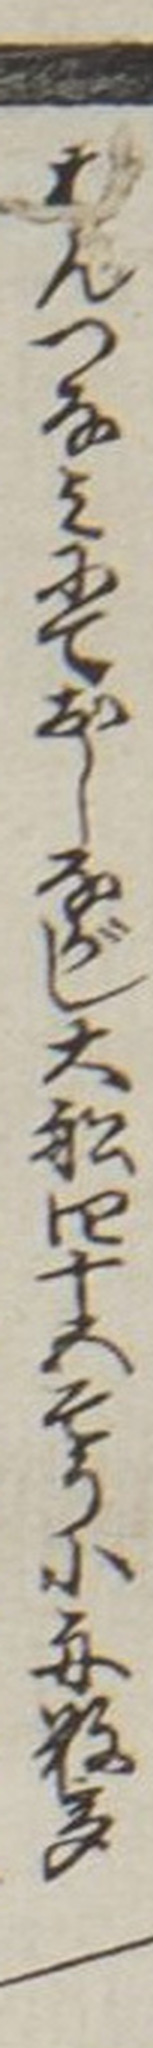はんつなみにておしながし大船四十五そう小舟数多
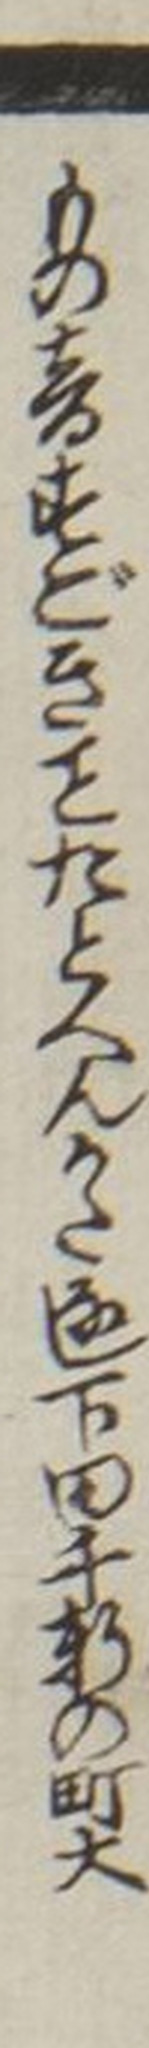もの音すごきことたとへんかたなし下田千軒の町大
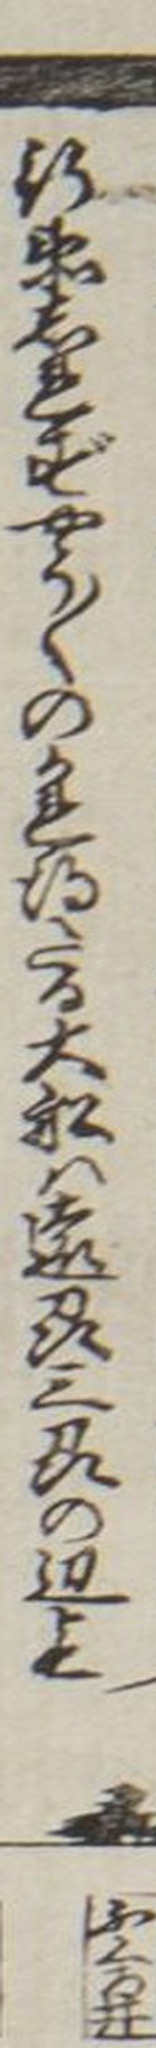行ゑしれずやう〳〵のかれ侍たる大船は遠州三州の辺迄
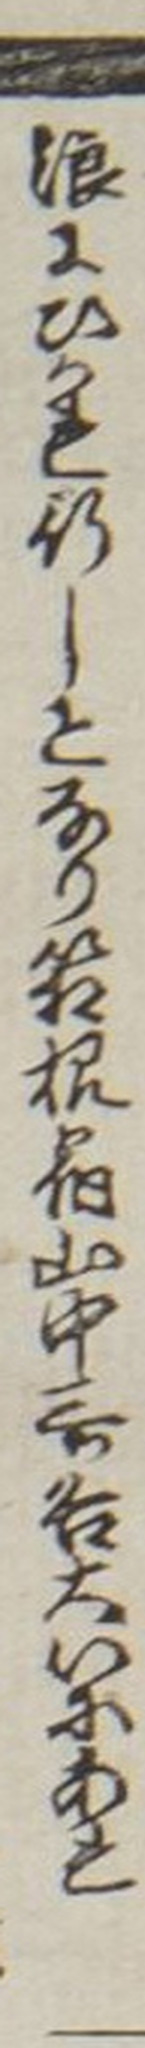浪にひかれ行しとなり箱根宿山中三ツたに大いにあれ
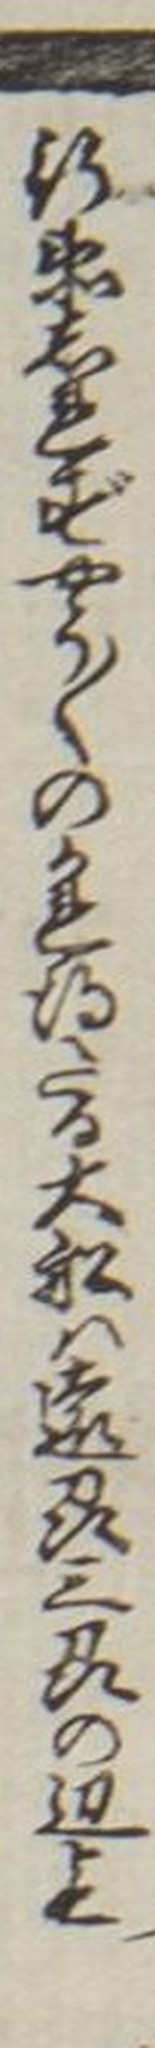行ゑしれずやう〳〵のかれ侍たる大船は遠州三州の辺迄
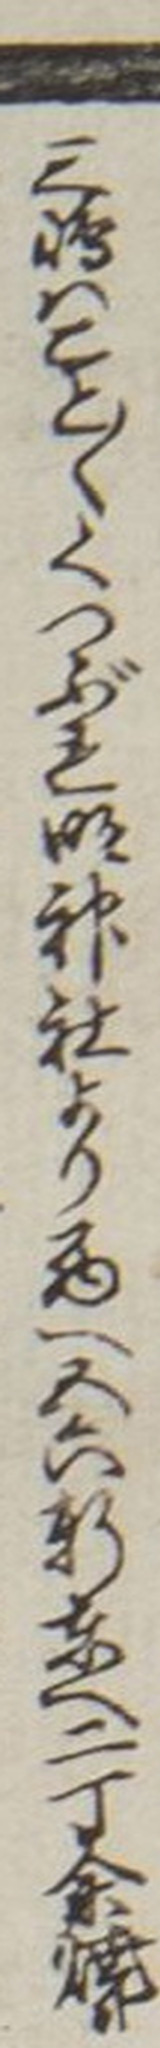三島はこと〳〵くつぶれ明神社より西へ五六軒東へ二丁余焼け
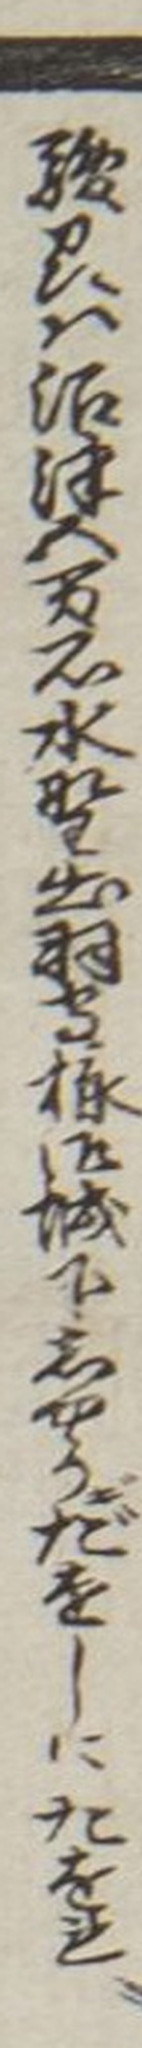駿州は沼津五万石水野出羽守様御城下しやうぎだをしにたをれ
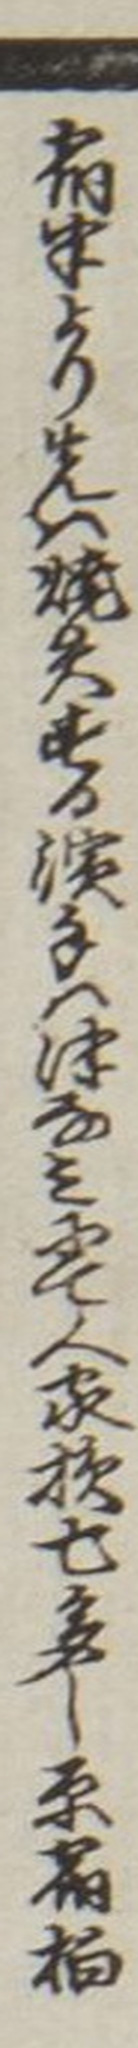宿半より先は焼失する浜手はつなみにて人家損亡多し原宿柏
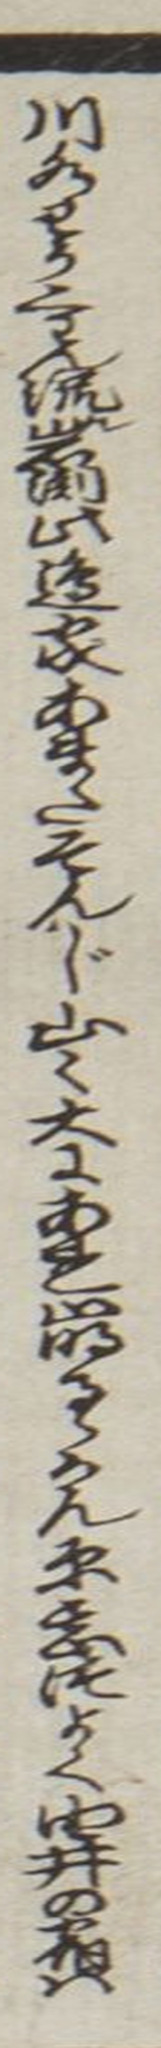川水りうくわん流れ岩淵此辺家あまたそんじ山々大にあれ崩るゝかん原甚つよく由井の宿は
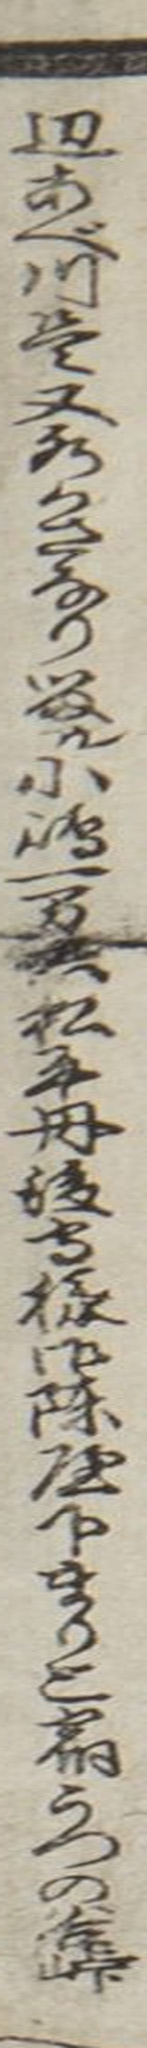辺あべ川是又水かさなり留る小島一万石松平丹後守様御陣屋下まりこ宿うつの谷峠
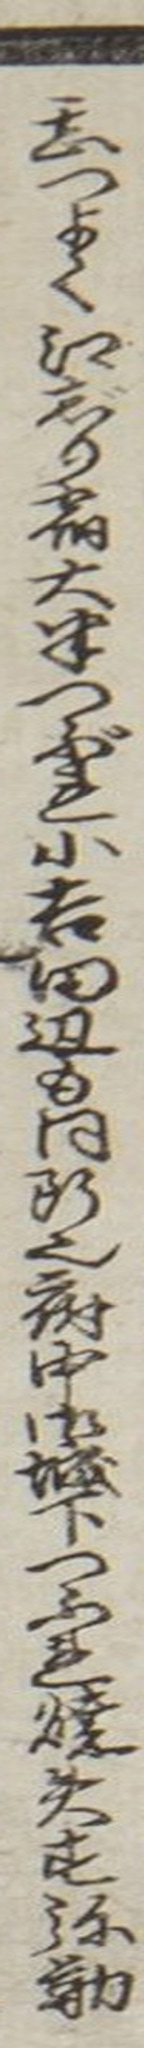甚つよく江じり宿大半つぶれ小吉田辺も同断也府中御城下つふれ焼失す弥勒
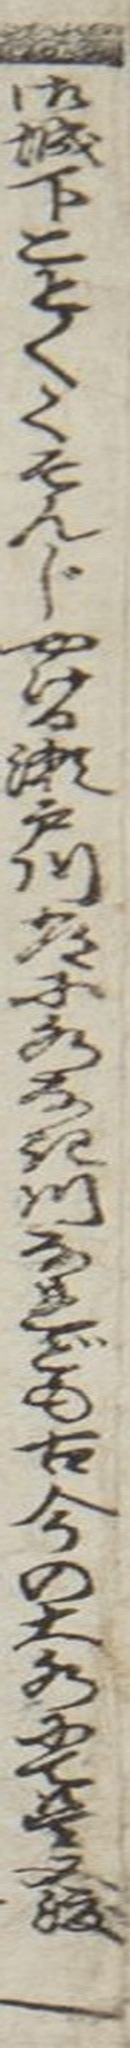御城下こと〳〵くそんじやける瀬戸川常に水なき川なれども古今の大水にて是又渡
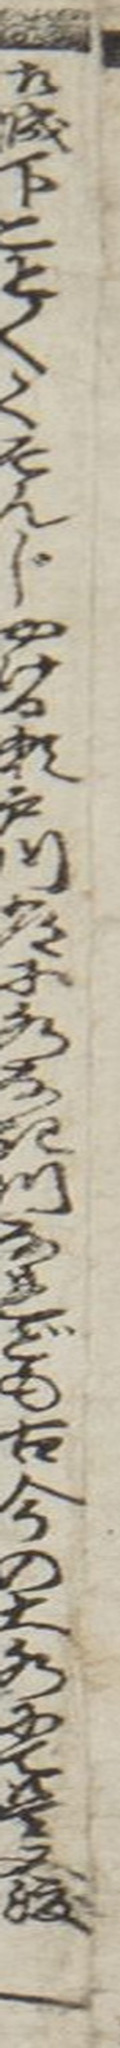御城下こと〳〵くそんじやける瀬戸川常に水なき川なれども古今の大水にて是又渡
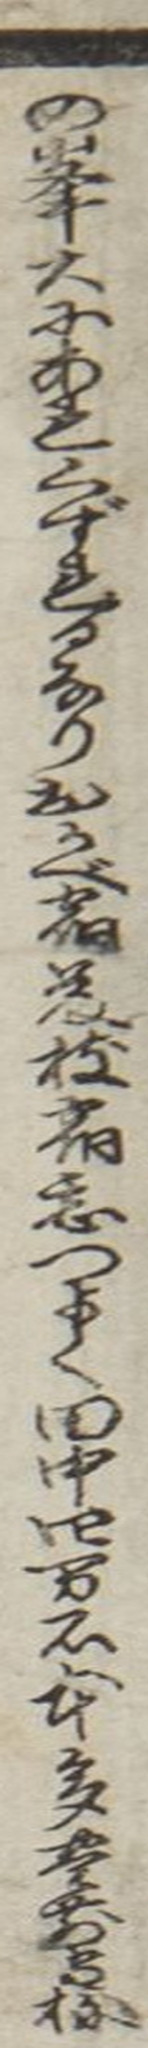の峯大にあれくずれるなりおかべ宿藤枝宿甚つよく田中四万石本多豊前守様
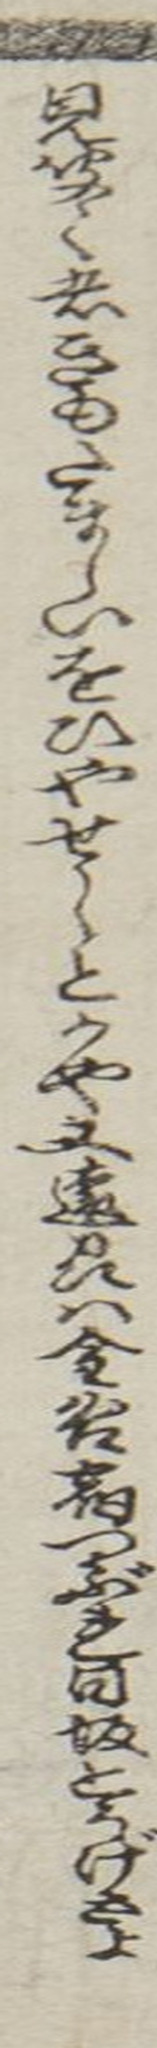見聞く者きもたましいをひやせしとかや又遠州は金谷宿つぶれ日坂とうげさよ
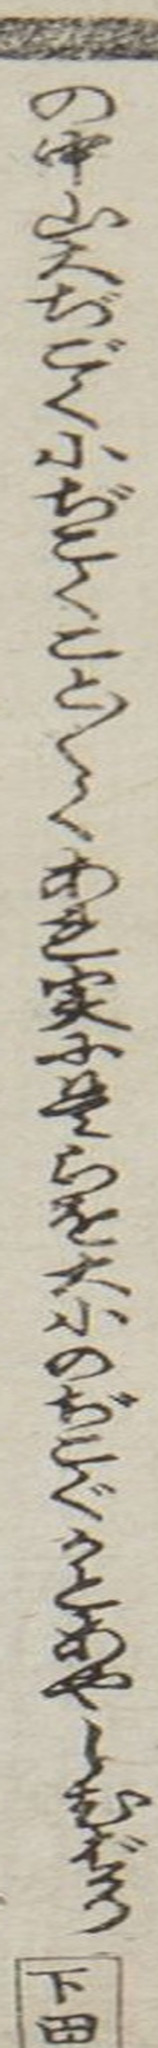の中山大ぢごく小ぢごくこと〳〵くあれ実に是らを大小のぢごくかとあやしむばかり
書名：十箇国大地震の図
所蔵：あいおいニッセイ同和損保株式会社
